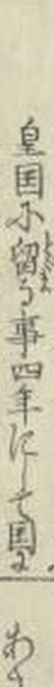皇国に留る事四年にして国に
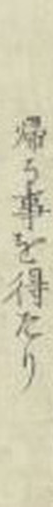帰る事を得たり
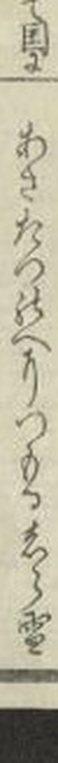あさたつのへにつもるしら雪
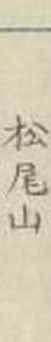松尾山
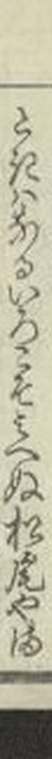ときはなるいろこそみへぬ松尾やま
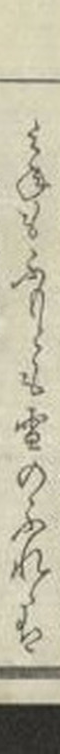みねもふもとも雪のふれゝは

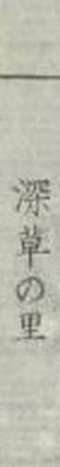深草の里
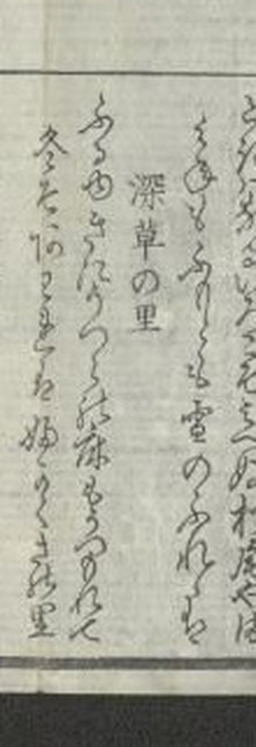ふるゆきにうつみの床もうつもれて
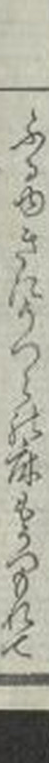ふるゆきにうつみの床もうつもれて
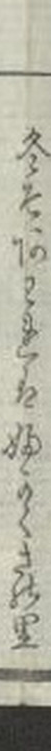冬そあわれはふかくさの里
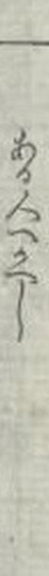ある人へかへし
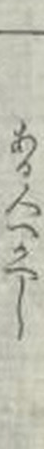ある人へかへし
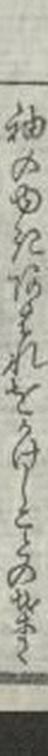袖のゆきあはれをかけしことの葉々
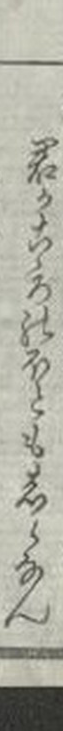君かこゝるのほともしらなん
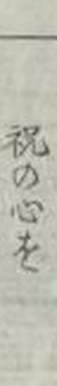祝の心を
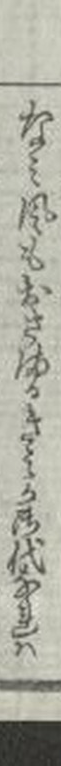なみ風もおさまるきみか御代なれは
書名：中山国使略
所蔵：University of the Ryukyus Library
